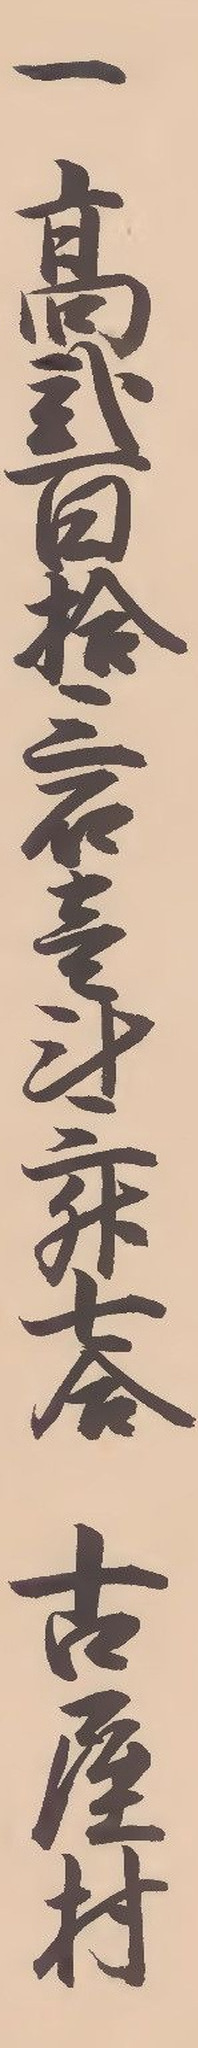一高弐百拾三石壱斗三升七合古屋村

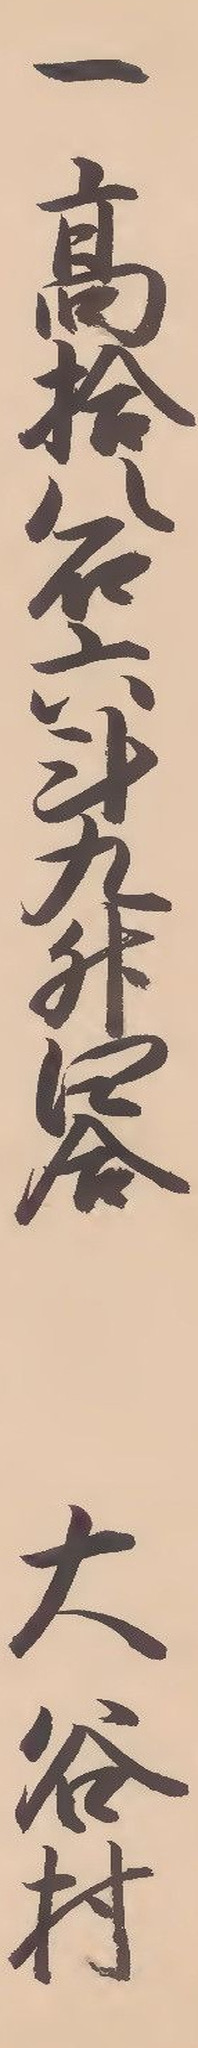一高拾八石六斗九升四合大谷村
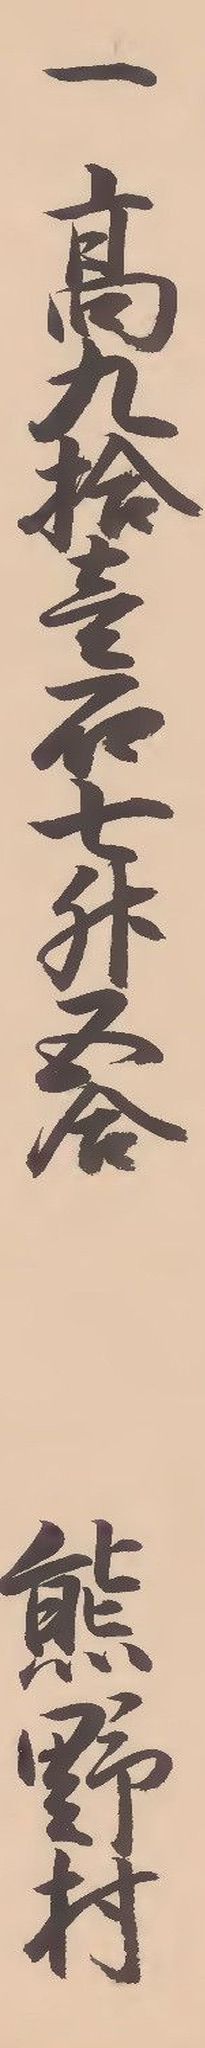一高九拾壱石七升五合熊野村
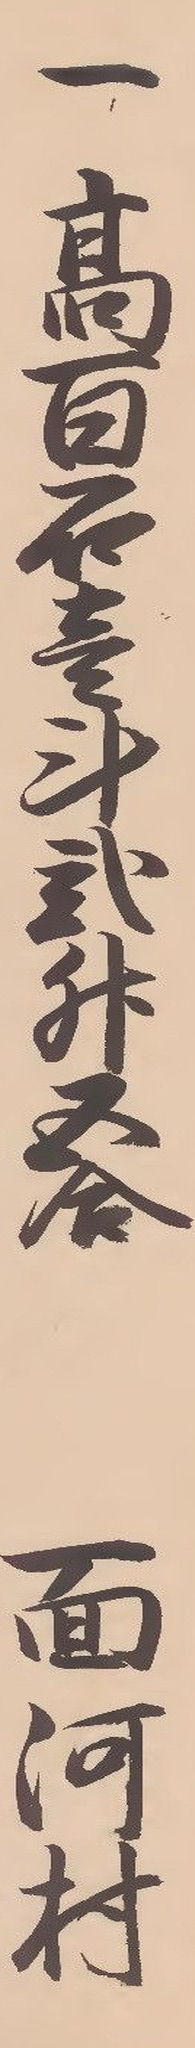一高百石壱斗弐升五合面河村
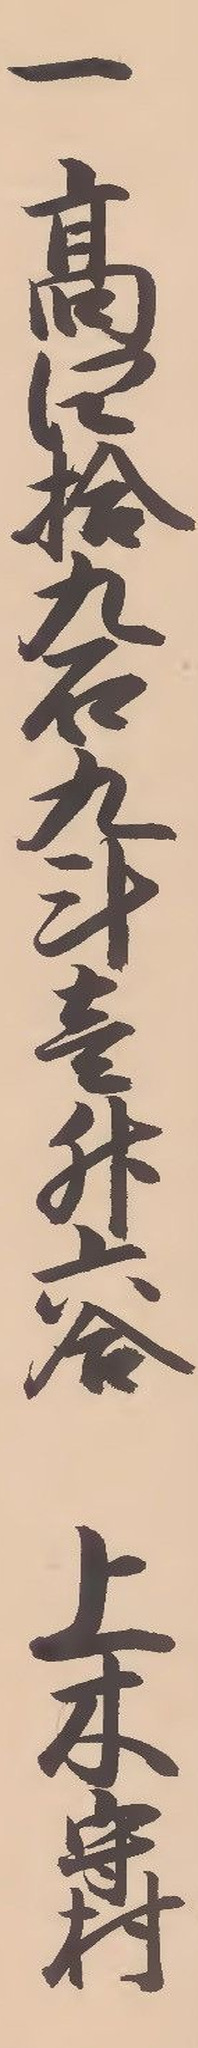一高四拾九石九斗壱升六合上木守村
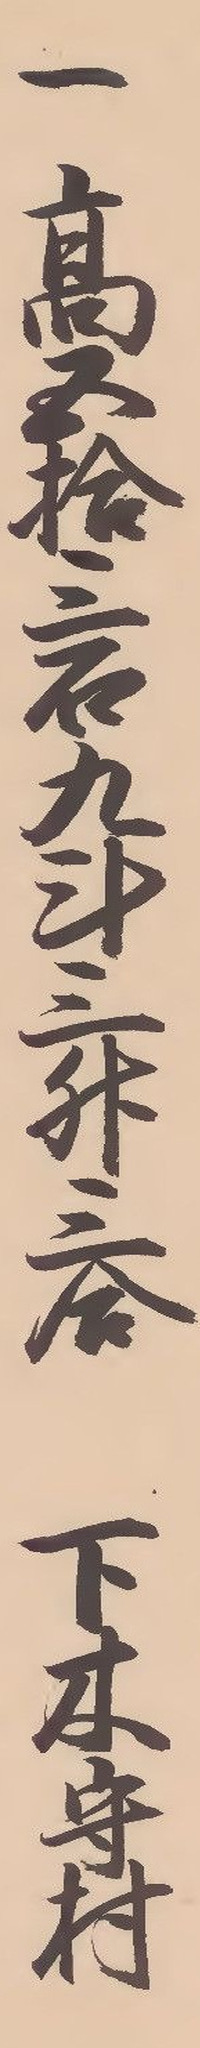一高五拾三石九斗三升三合下木守村
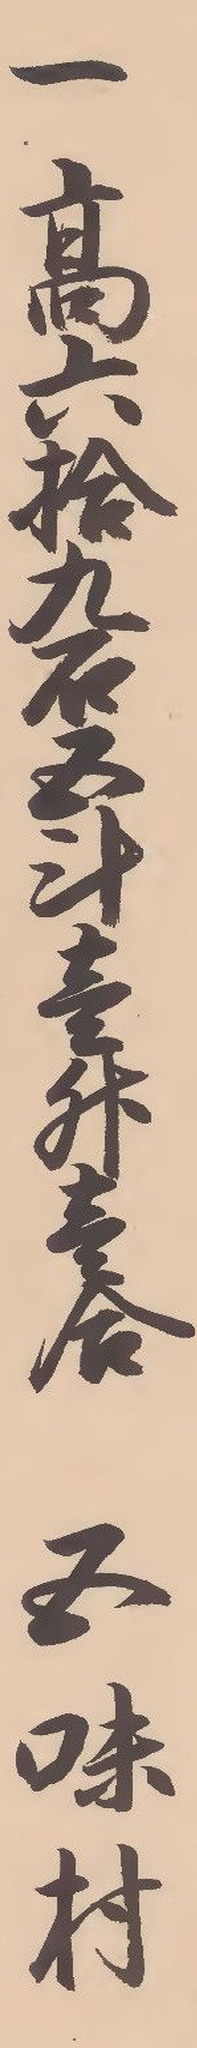一高六拾九石五斗壱升壱合五味村
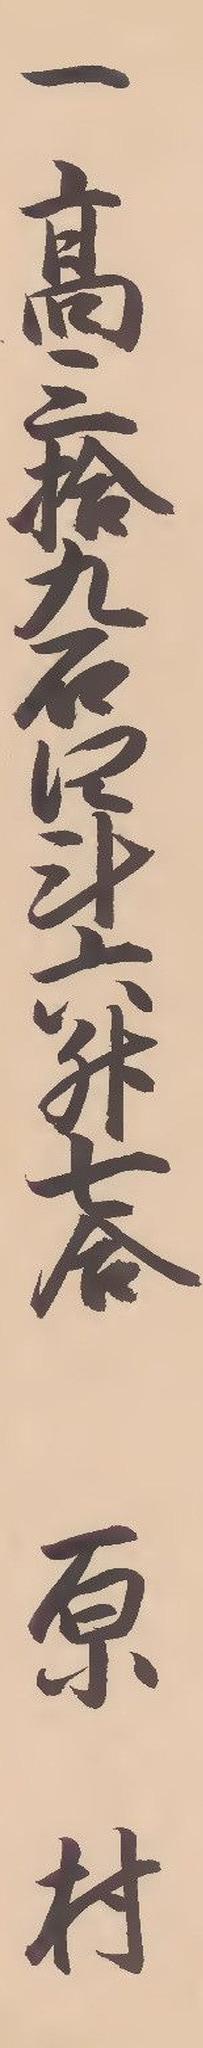一高三拾九石四斗六升七合原村

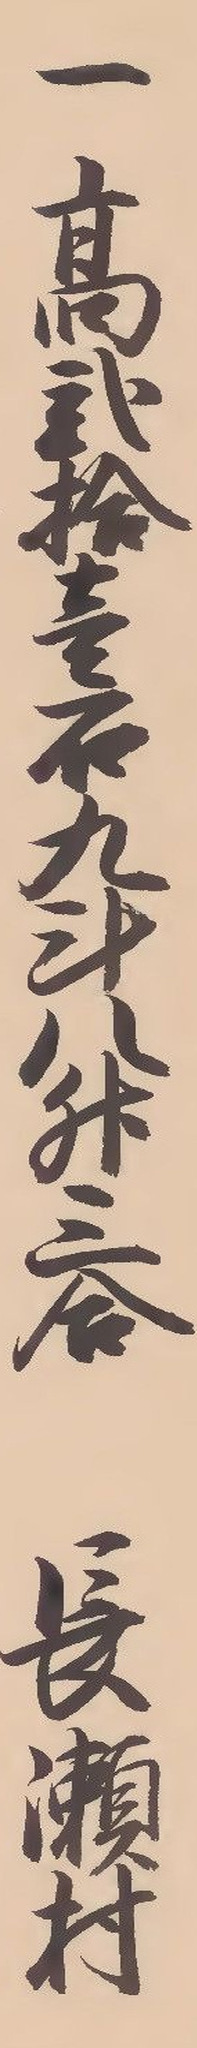一高弐拾壱石九斗八升三合長瀬村
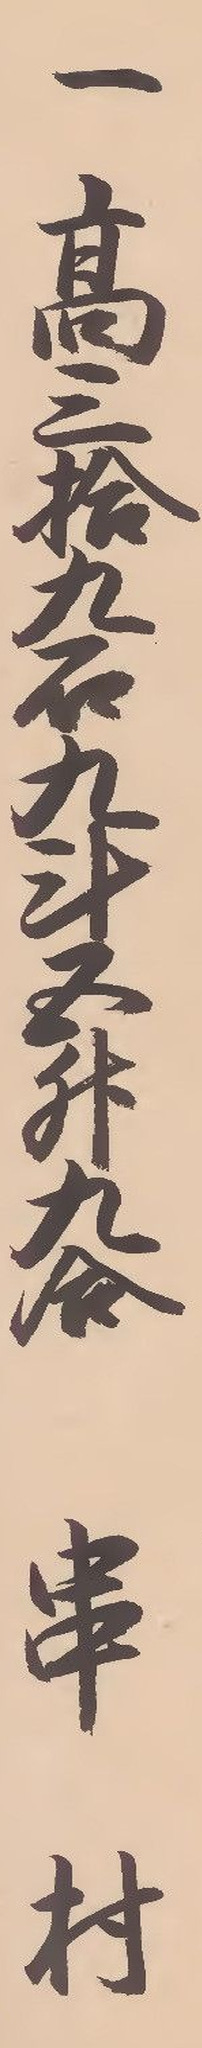一高三拾九石九斗五升九合串村
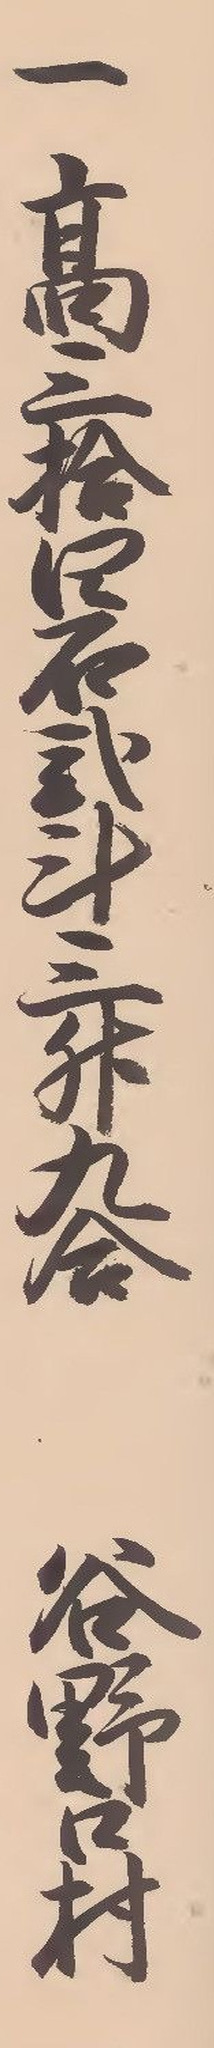一高三拾四石弐斗三升九合谷野口村
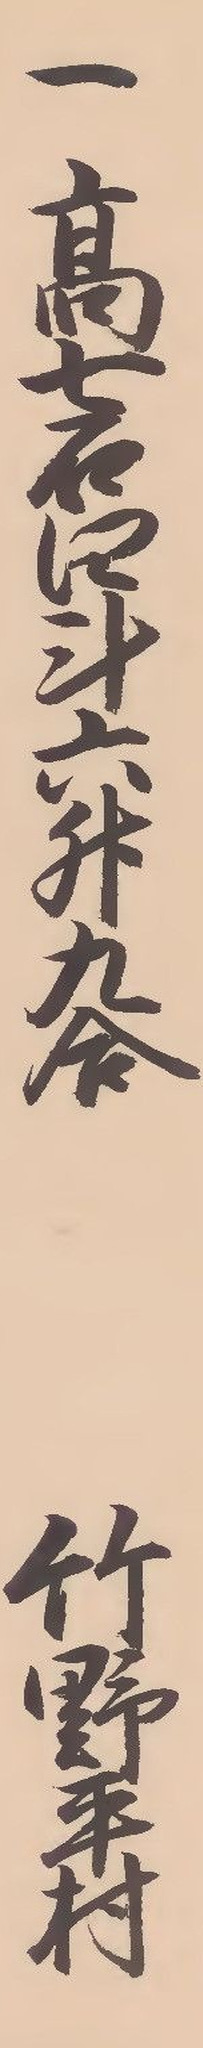一高七石四斗六升九合竹野平村
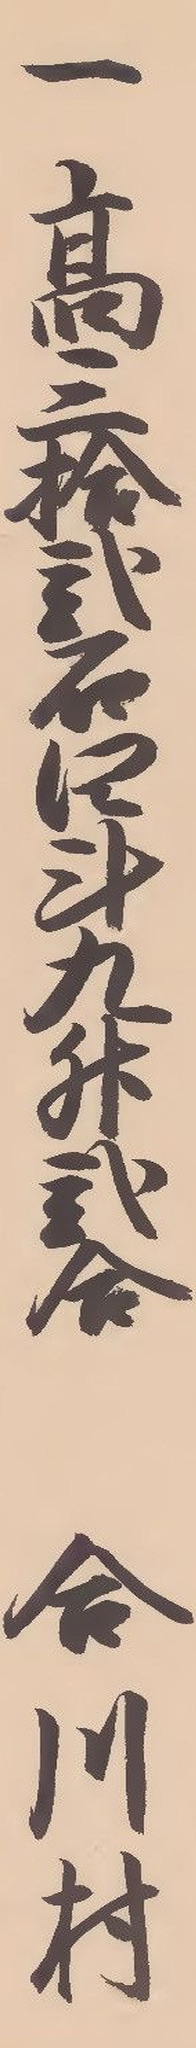一高三拾弐石四斗九升弐合合川村
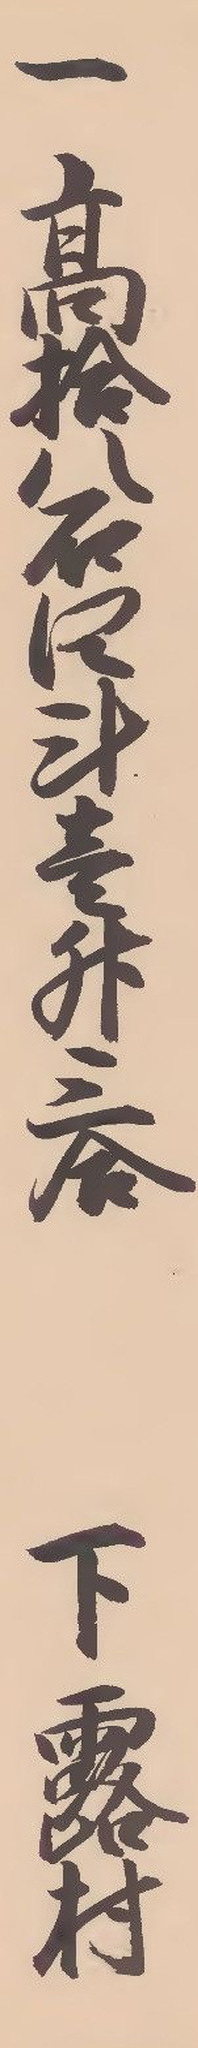一高拾八石四斗壱升三合下露村

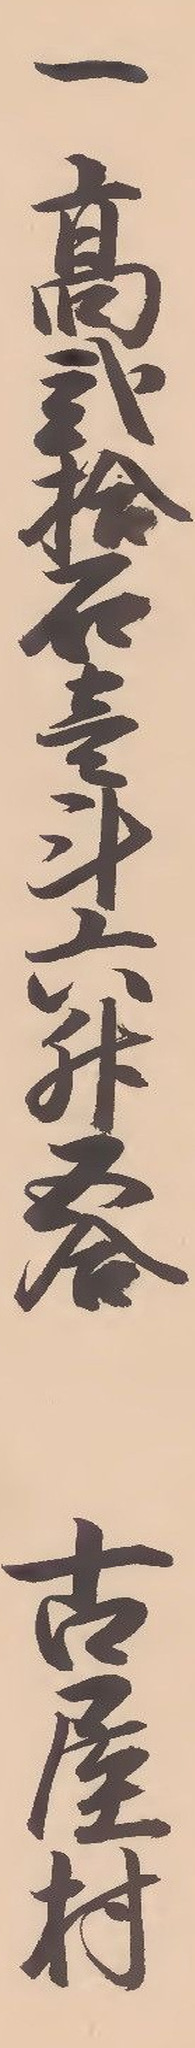一高弐拾石壱斗六升五合古屋村
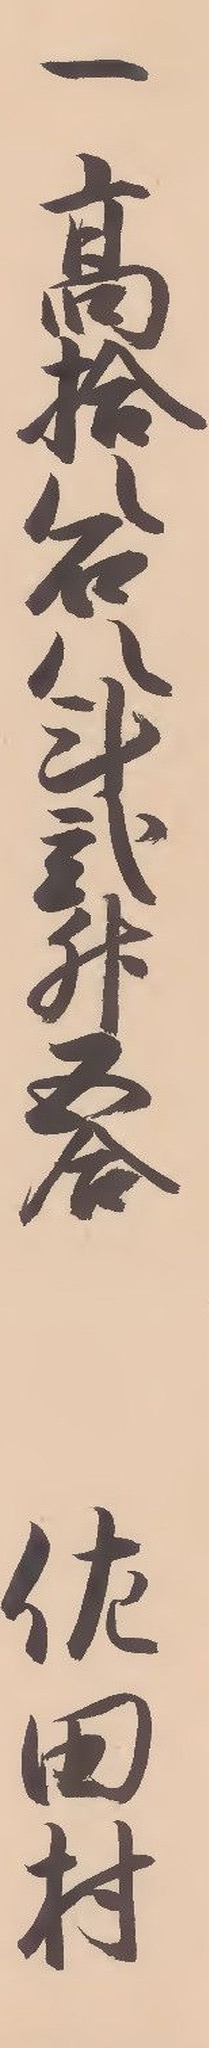一高拾八石八斗弐升五合佐田村
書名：紀伊国郷帳
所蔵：国立公文書館 National Archives of Japan
